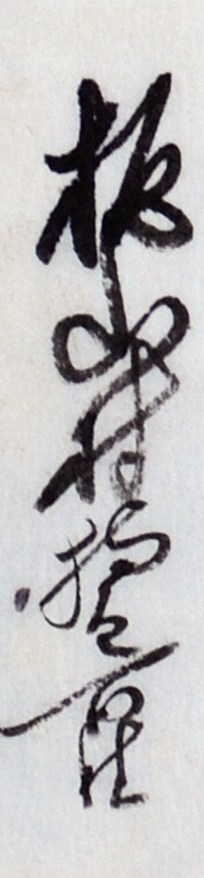板山村持主百姓

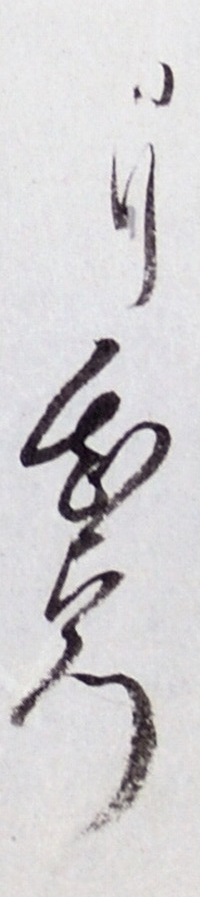同断甚右衛門
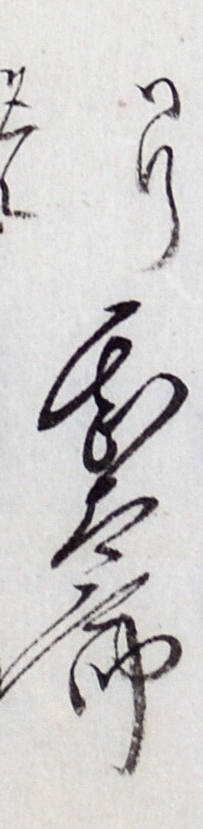同断甚太郎
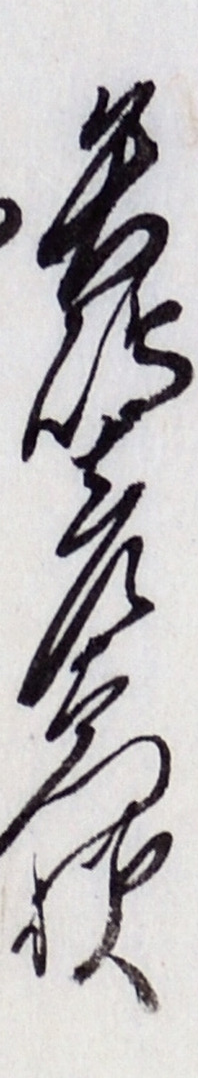矢嶋彦右衛門様
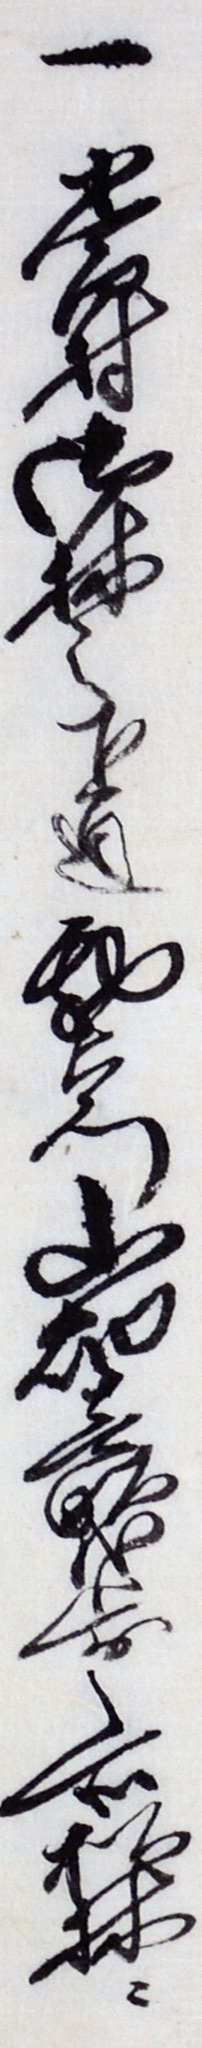一当村御林之下通勘右衛門山畑壱畝弐歩之所様林ニ
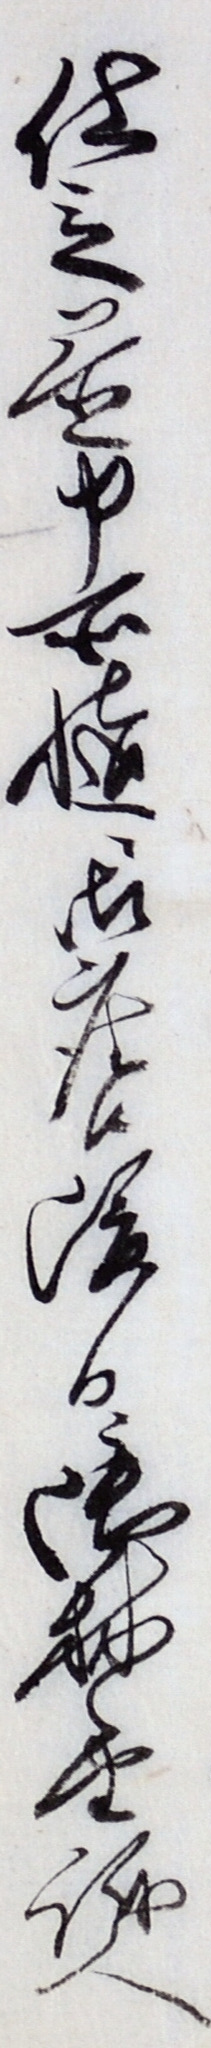仕立置申所慥ニ御座候後日ニ御林候由訴へ
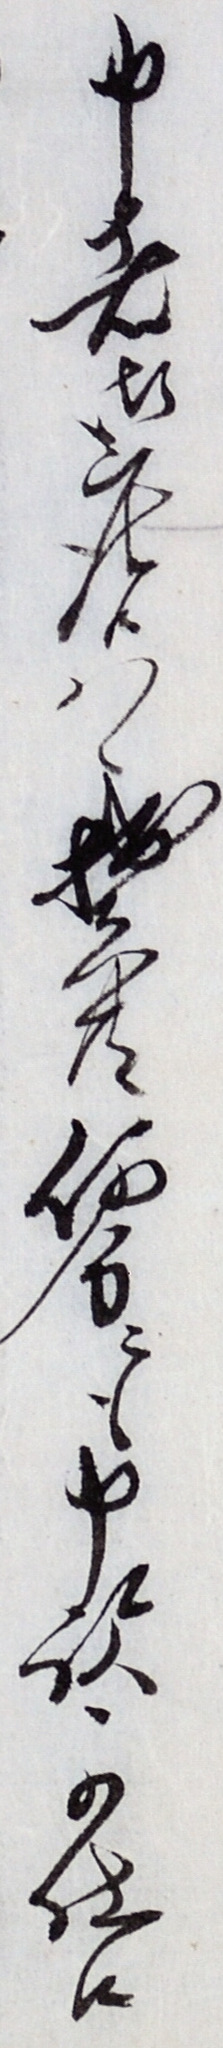申者御座候ハヽ拙者共何分ニも申訳可仕候
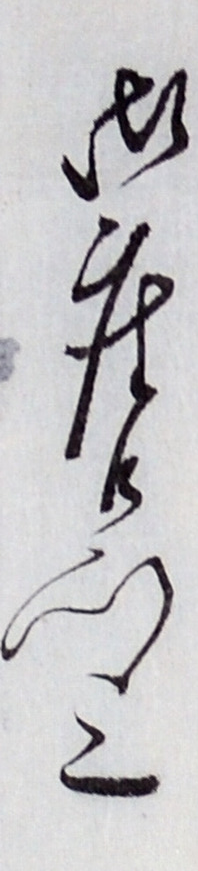御座候以上
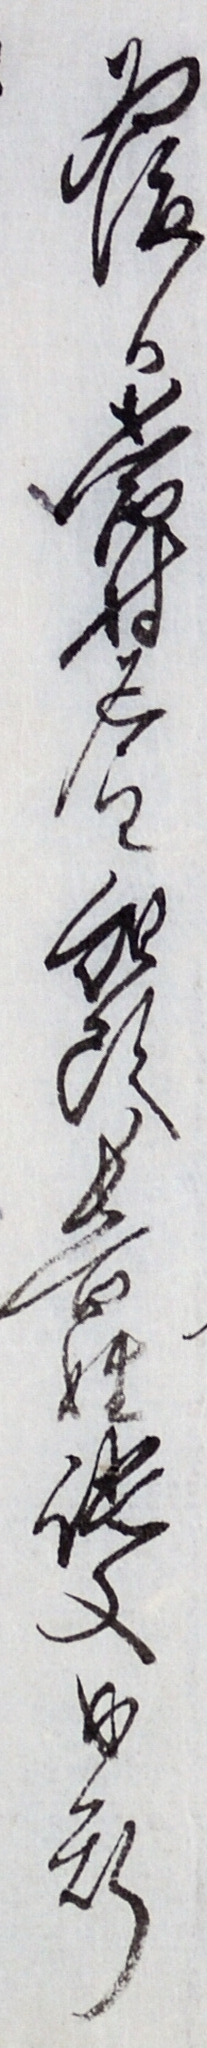為後日当村名主組頭長百姓証文如斯
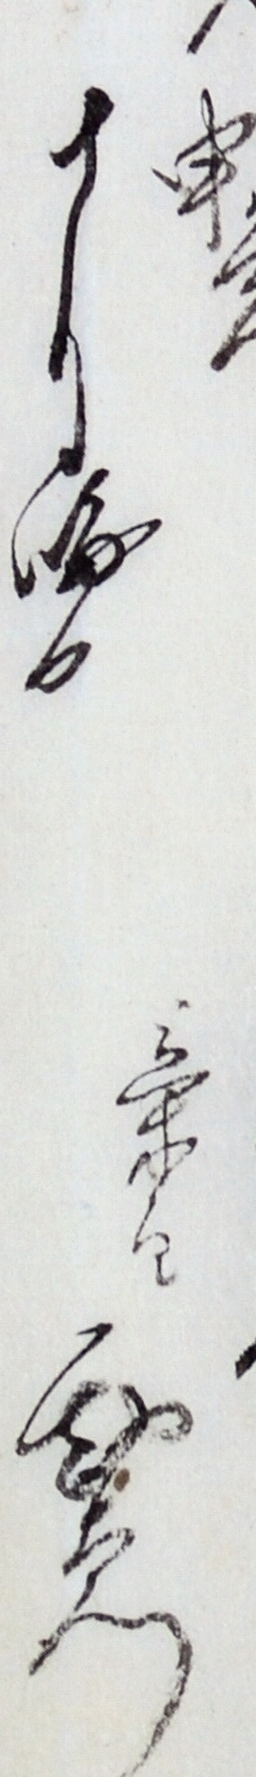十月晦日
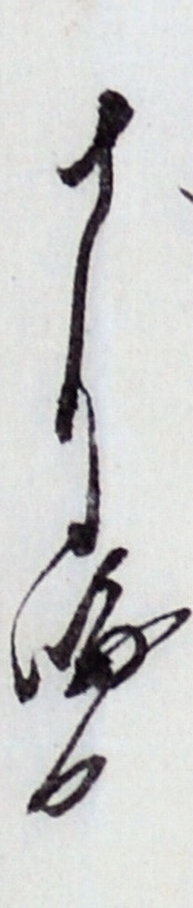十月晦日

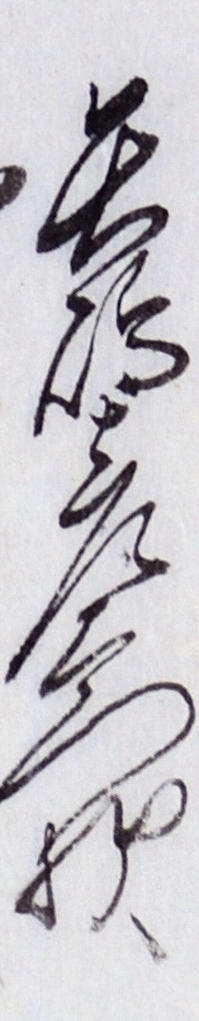矢嶋彦右衛門様
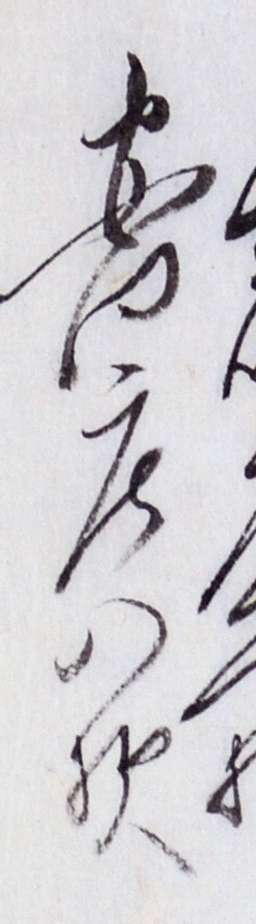安田庄八様
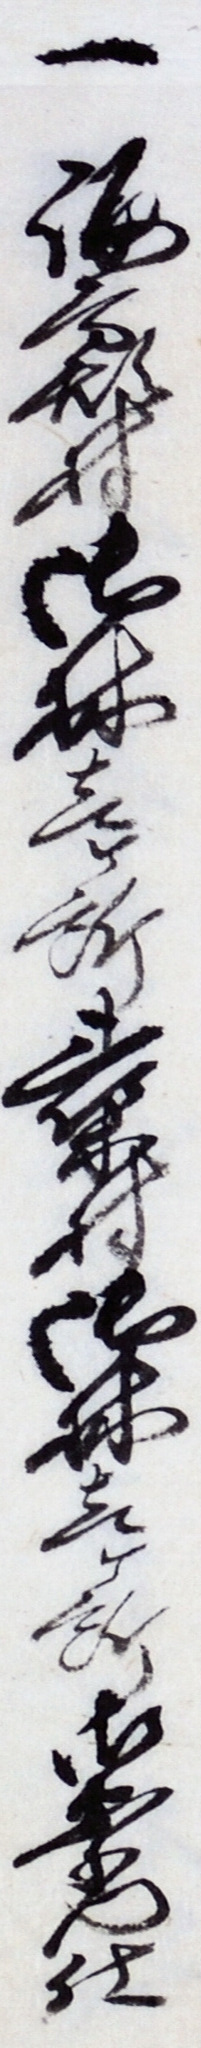一諏方形村御林壱ヶ所表木村御林壱ヶ所御案内仕
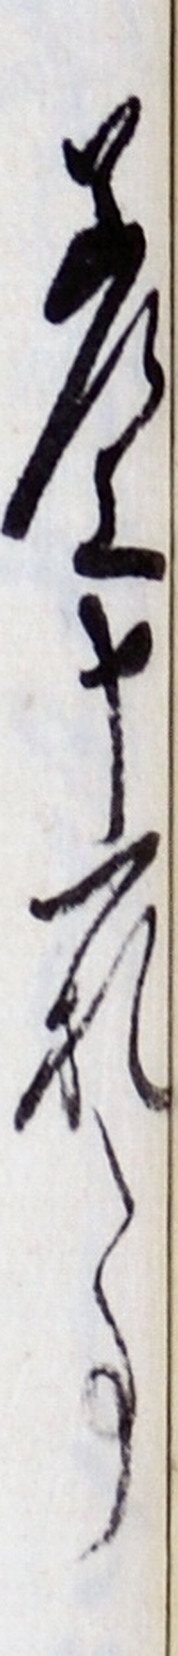差上申一札之事
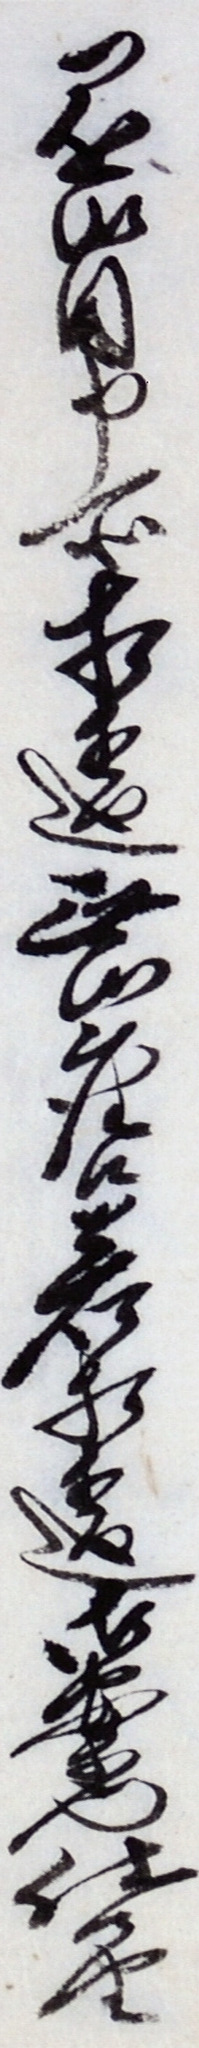懸御目申所相違無御座候若相違御案内仕候由
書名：御林御竹藪証文控
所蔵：伊那市立高遠町図書館・合同会社AMANE
